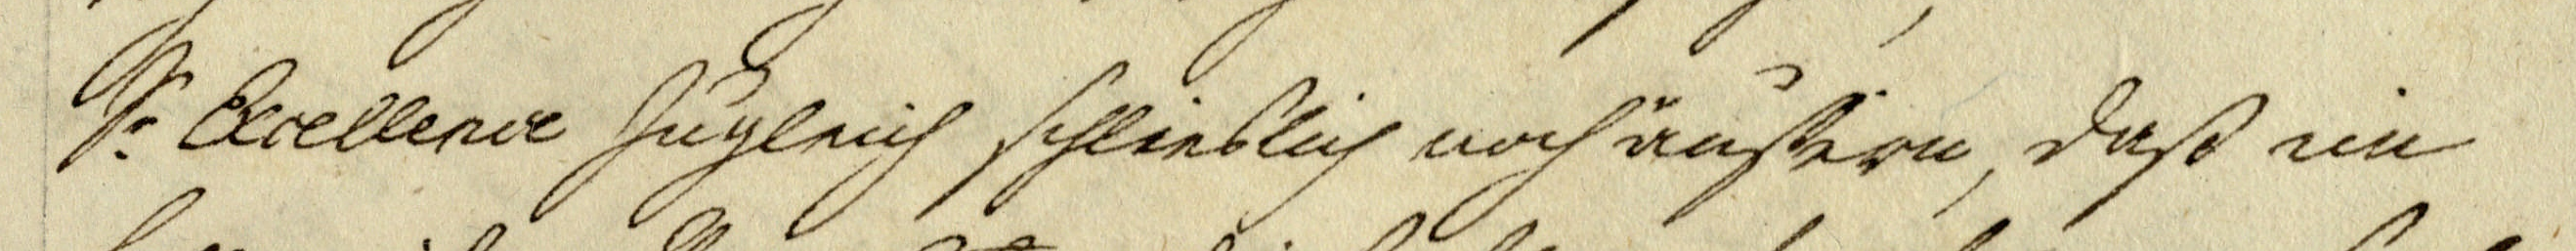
Sr Excellence zugleich schlieslich noch äussern, daß im
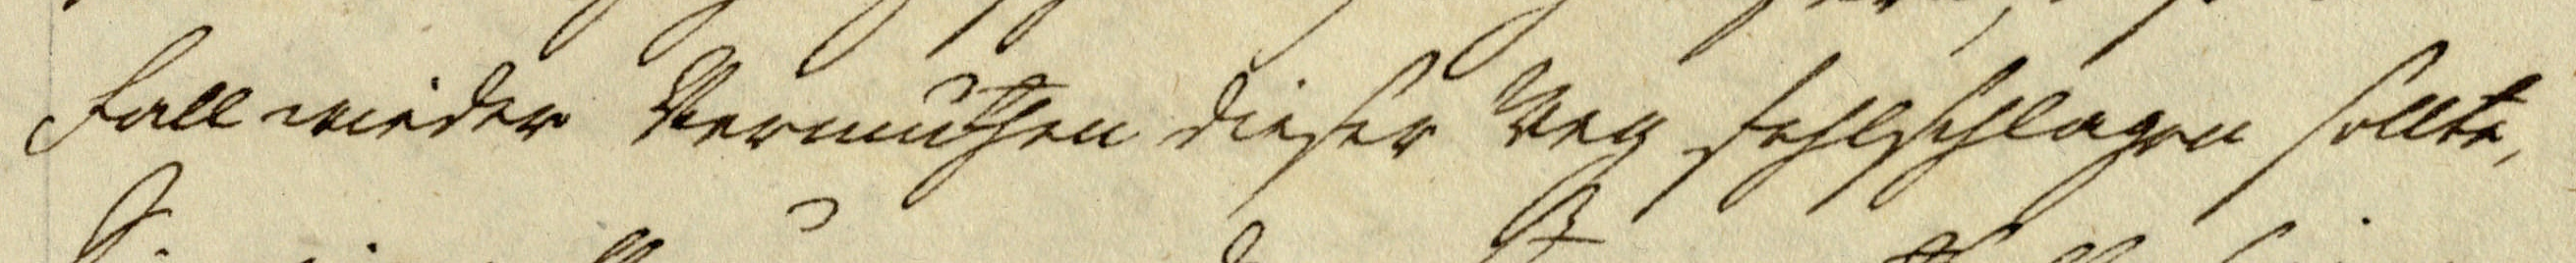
Fall wieder Vermuthen dieser Weg fehlschlagen sollte,
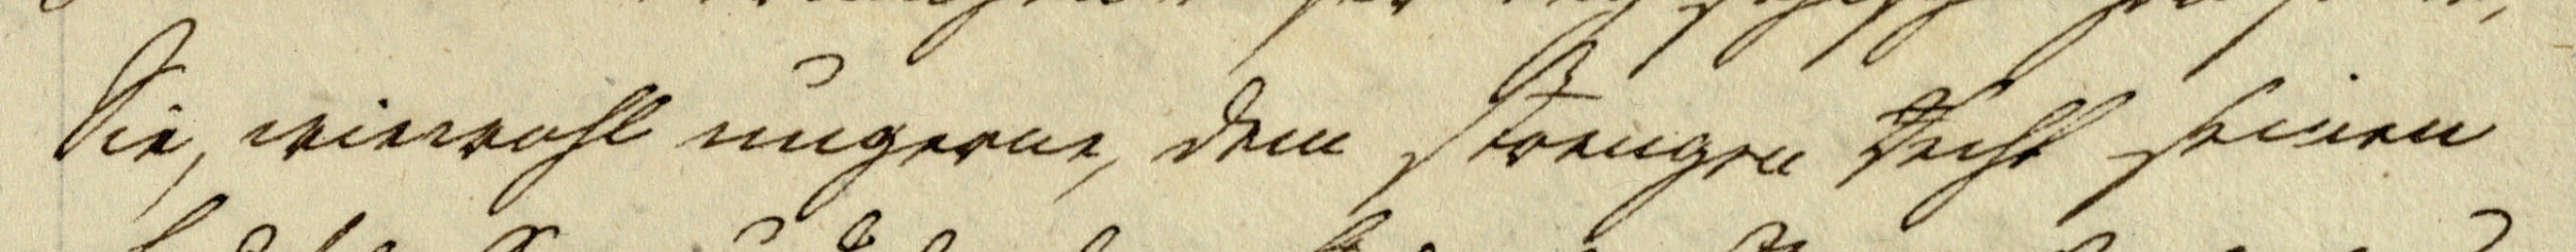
Sie, wiewohl ungerne, dem strengen Recht seinen
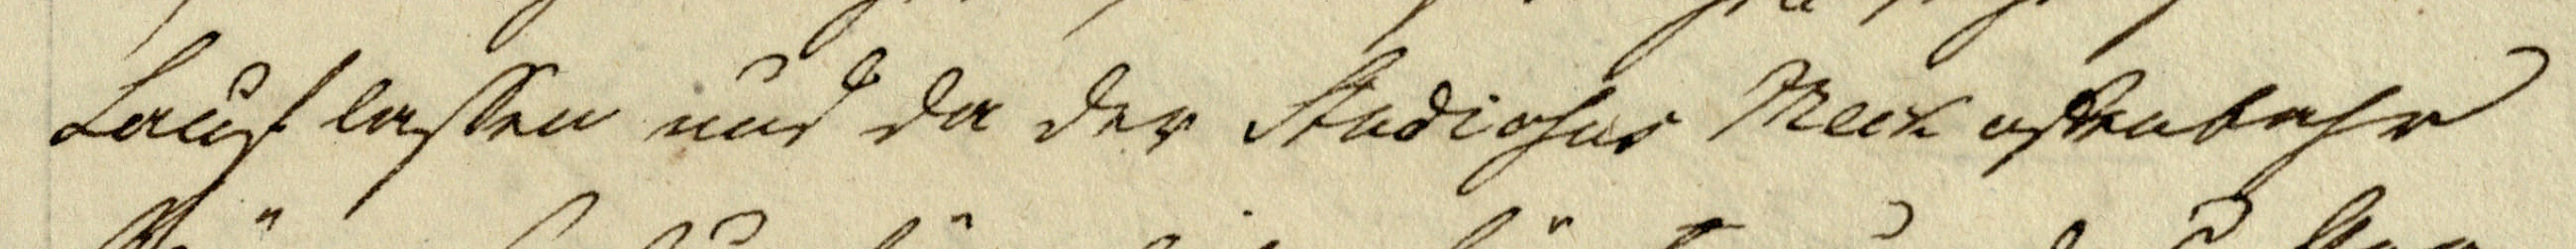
Lauf lassen und da der Studiosus Meck offenbahr
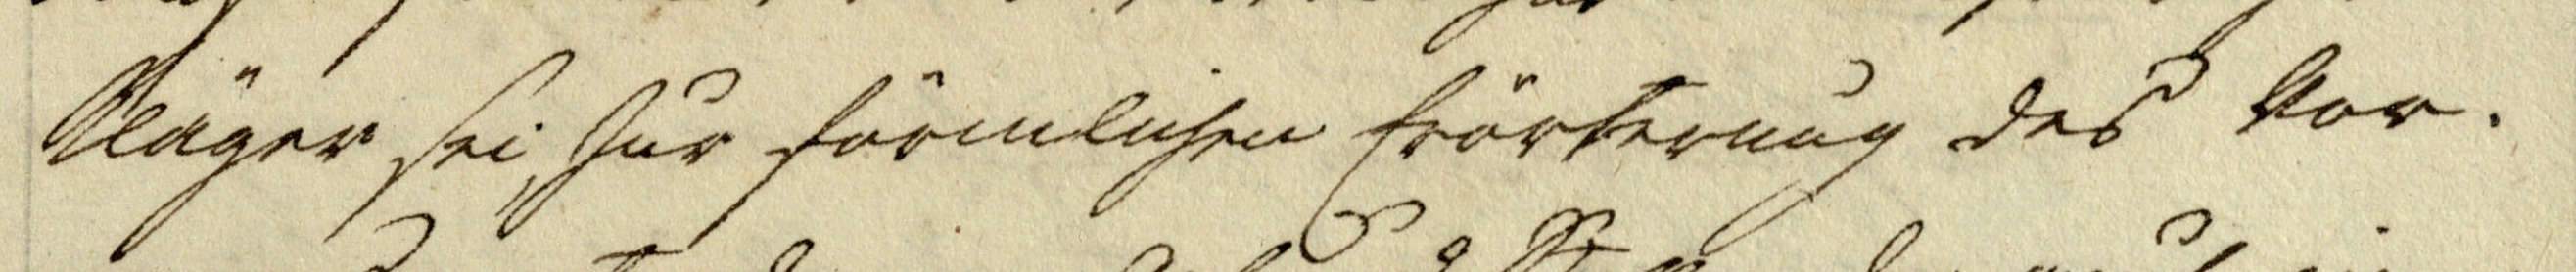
Kläger sei, zur förmlichen Erörterung des Vor¬
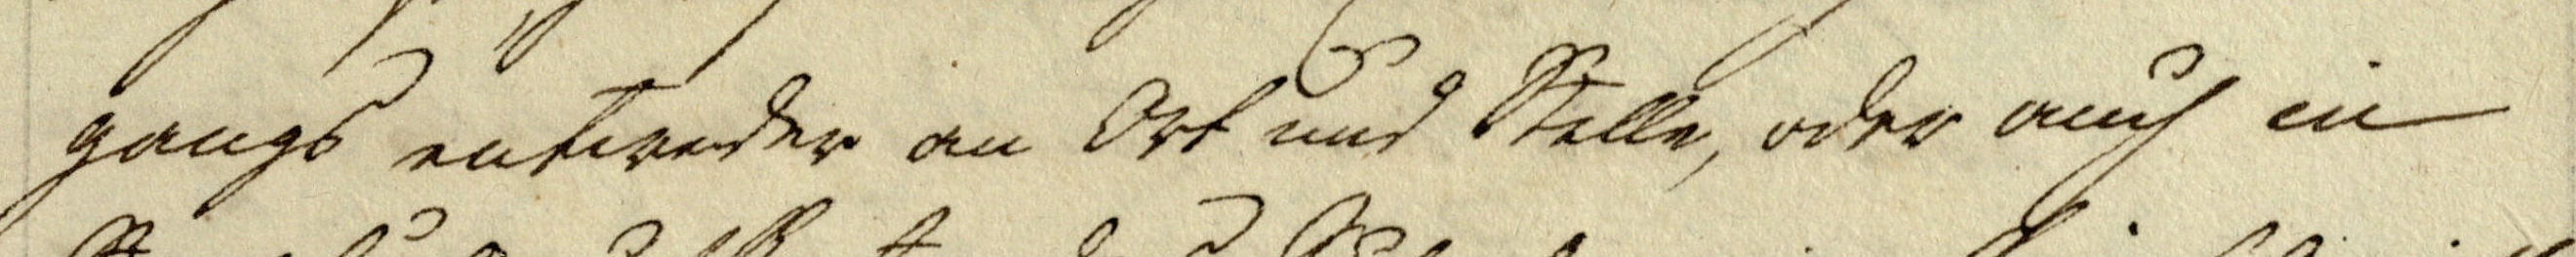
gangs entweder an Ort und Stelle, oder auch in
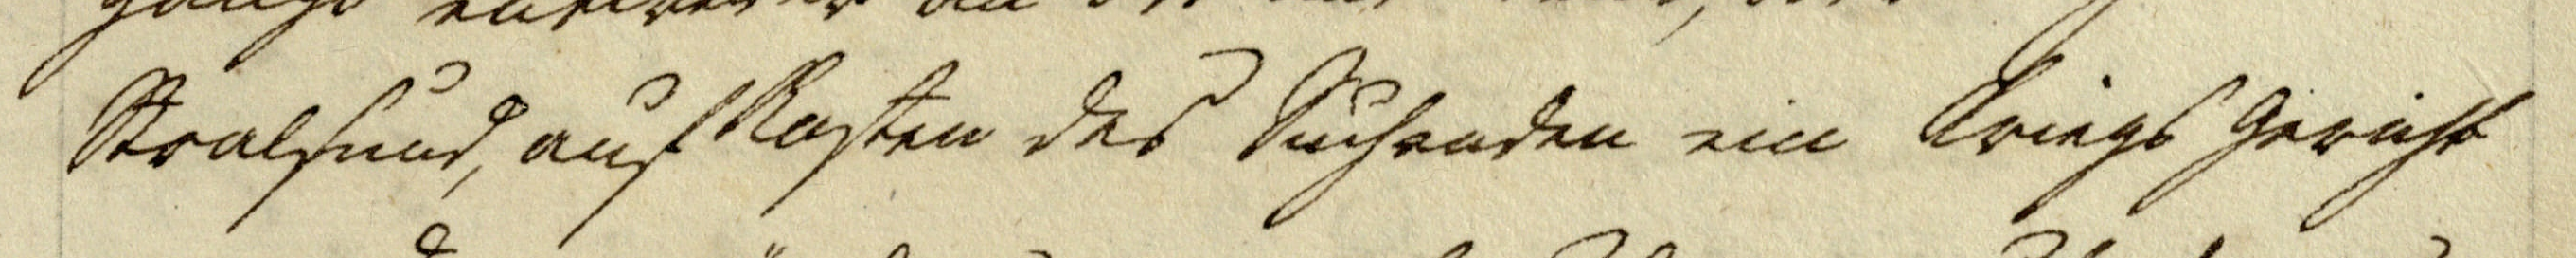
Stralsund, auf Kosten des Suchenden ein Kriegs Gericht
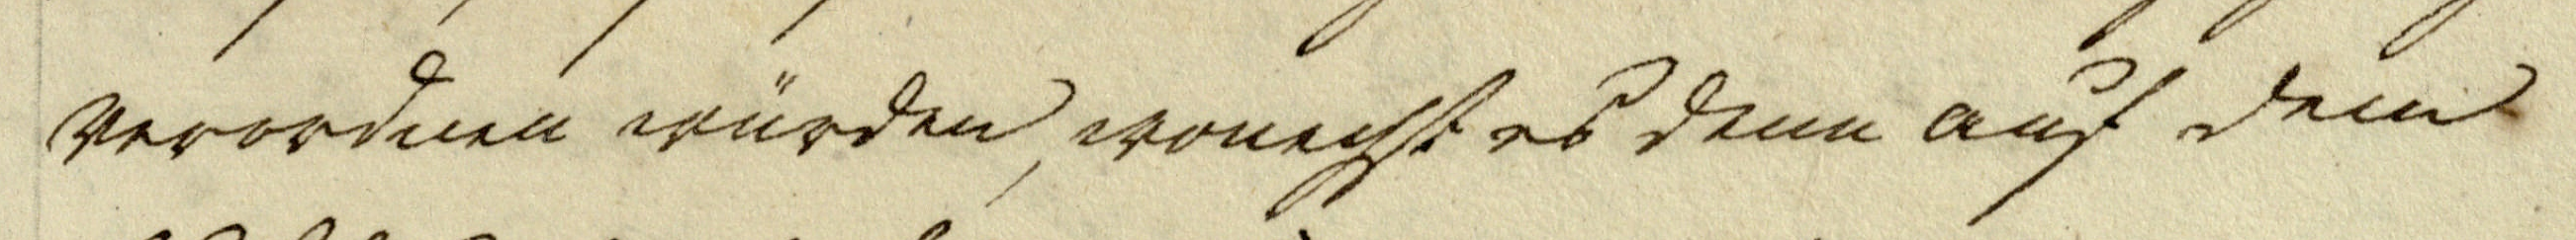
verordnen würden, wonechst es denn auf dem
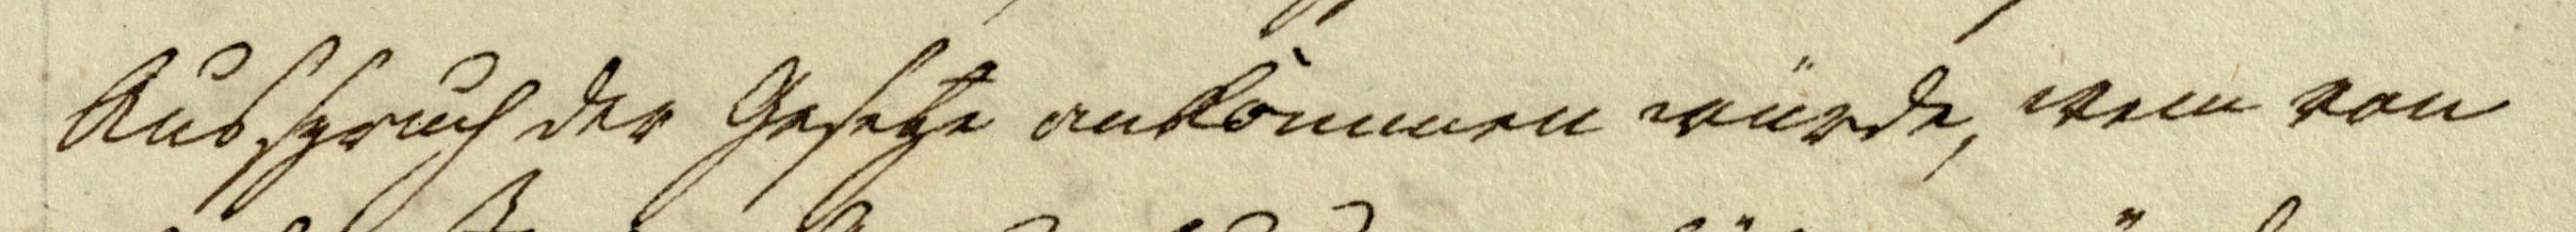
Ausspruch der Gesetze ankommen würde, wem von
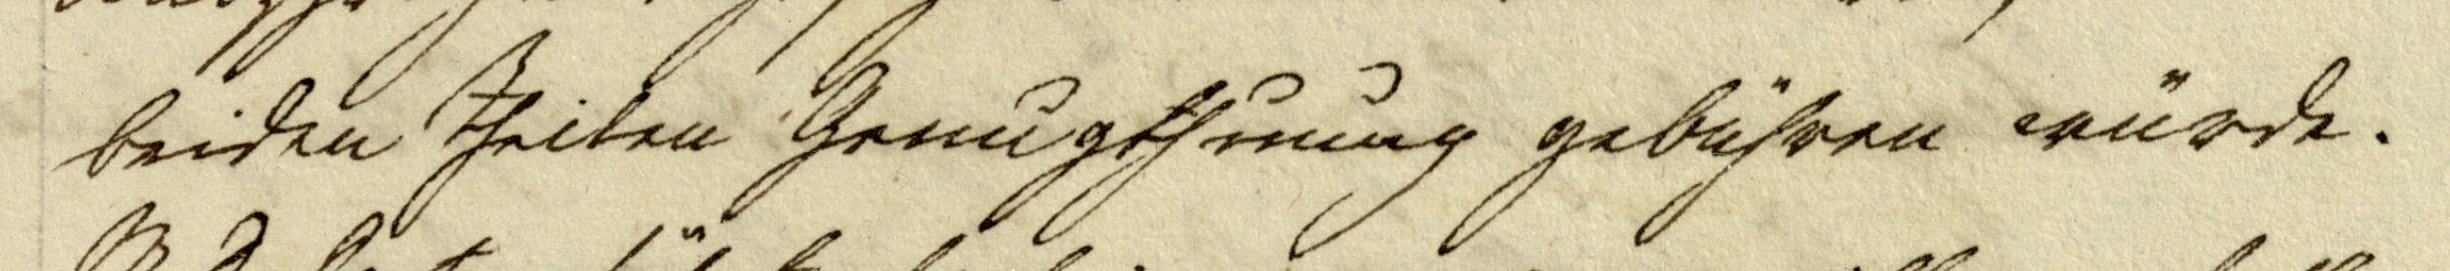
beiden Theilen Genugtuung gebühren würde.
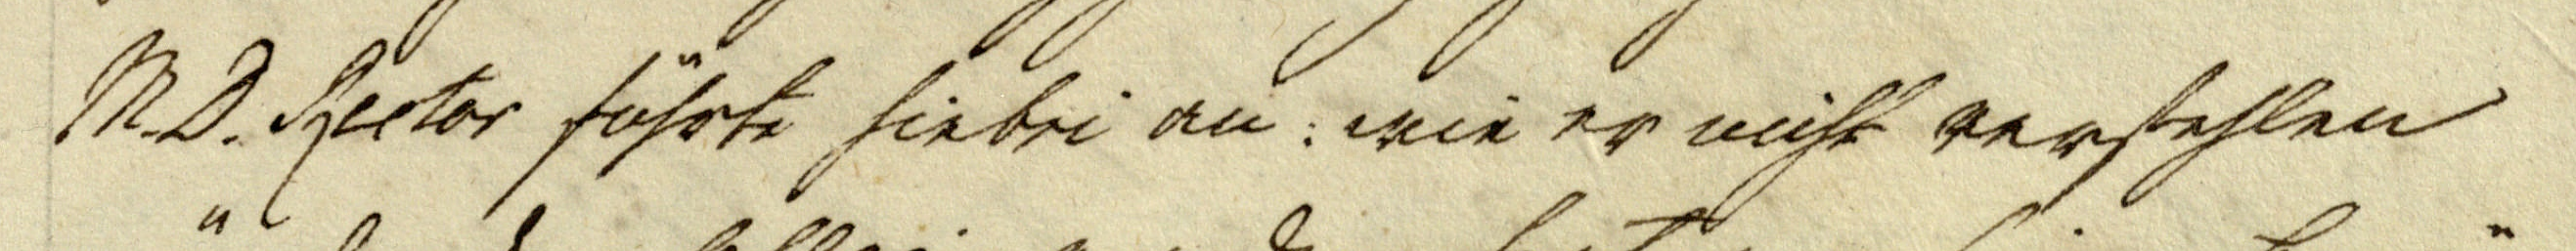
M. D. Rector führte hiebei an: wie er nicht verfehlen
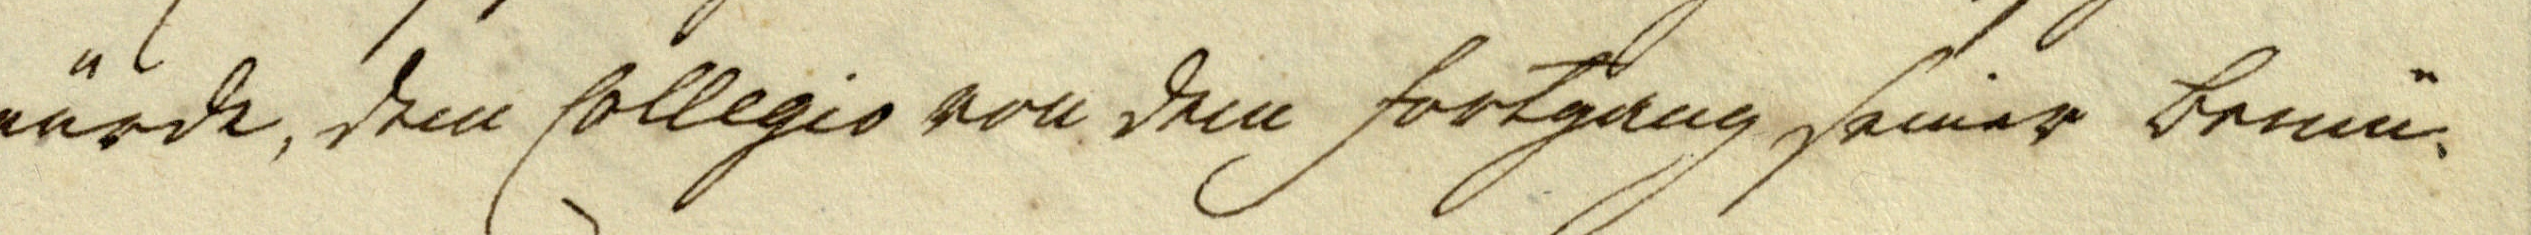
würde, dem Collegio von dem Fortgang seiner Bemü¬
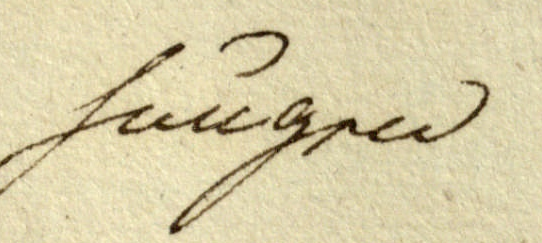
hungen
